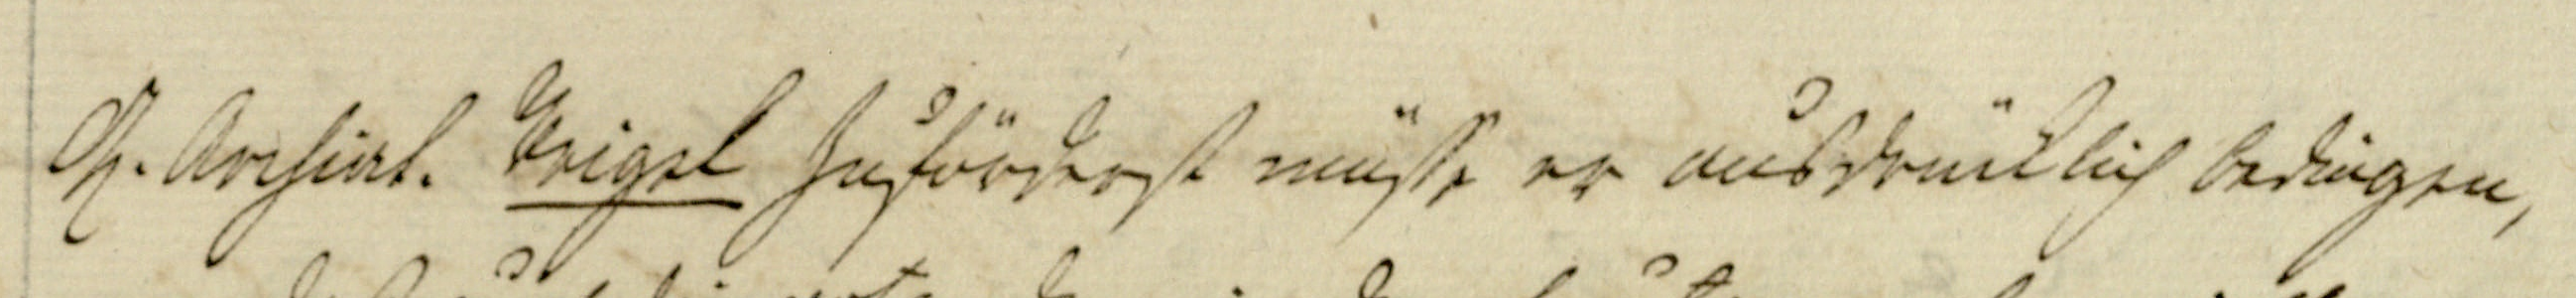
dh. Archiat. Weigel. Zuförderst müsse er ausdrücklich bedingen,
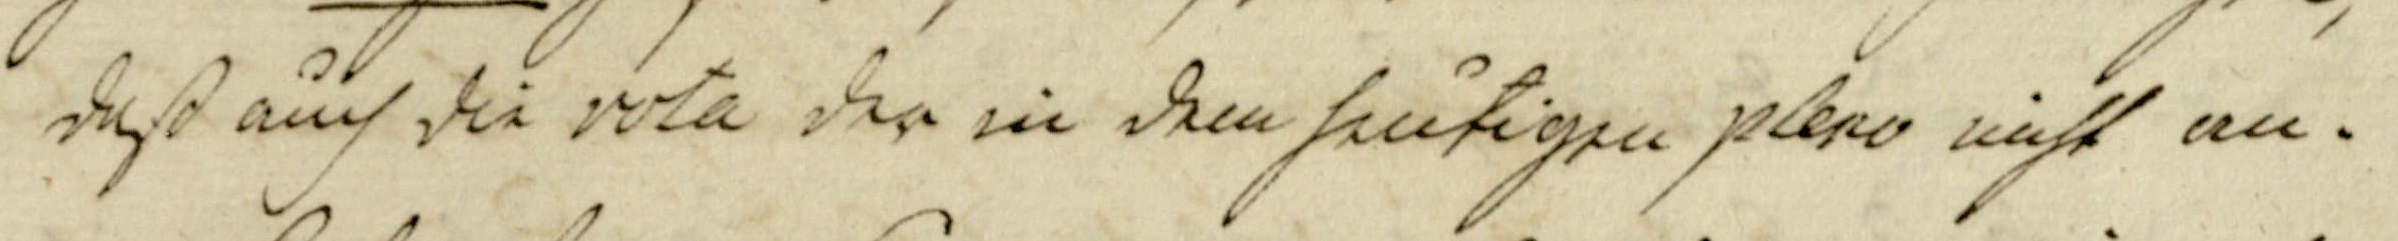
daß auch die vota der in dem heutigen pleno nicht an¬
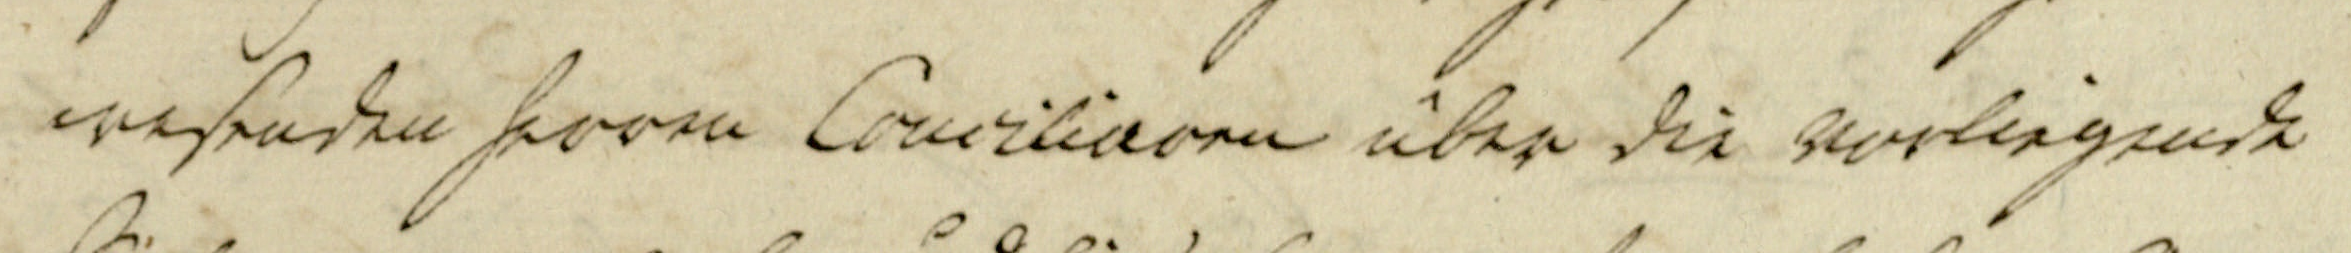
wesenden Herren Conciliaren über die vorliegende
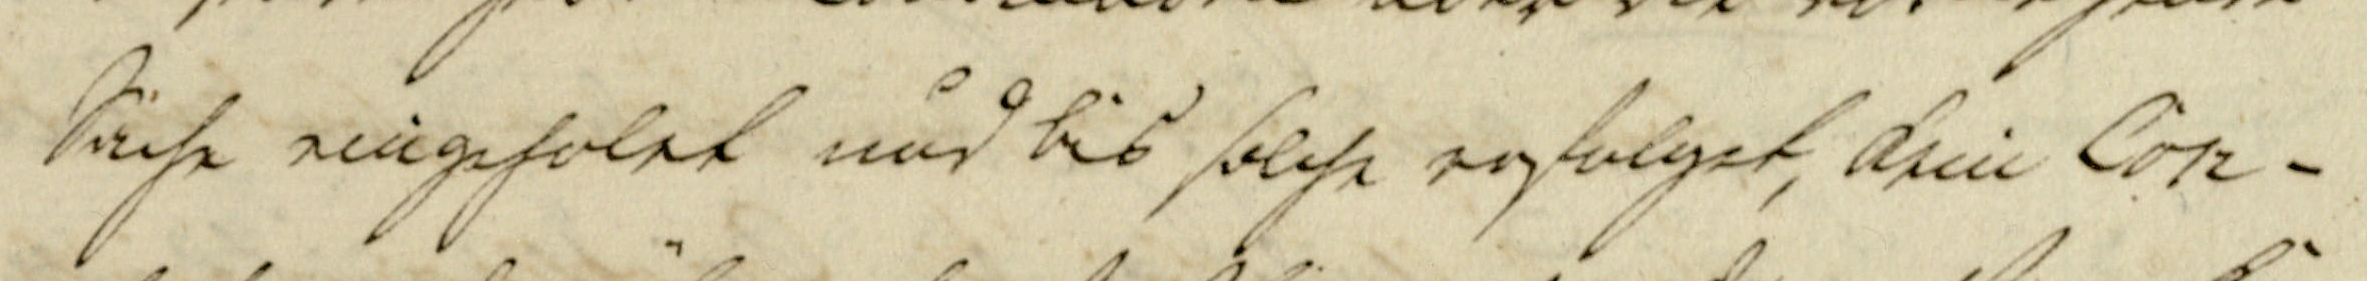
Sache eingeholet und bis solche erfolget, kein Con¬
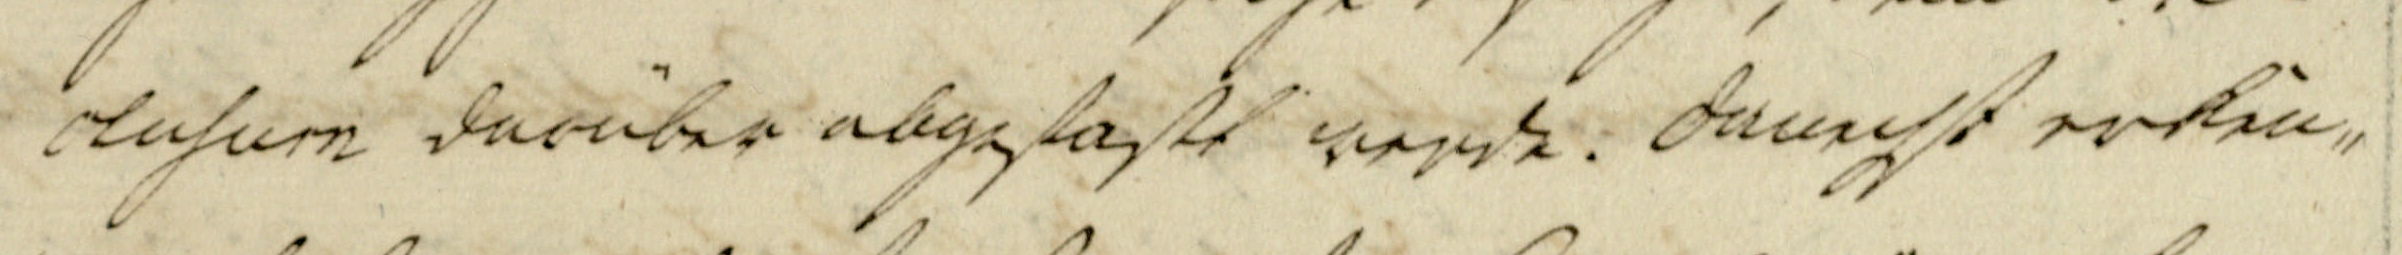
clusum darüber abgefaßt werde. Danechst erken¬
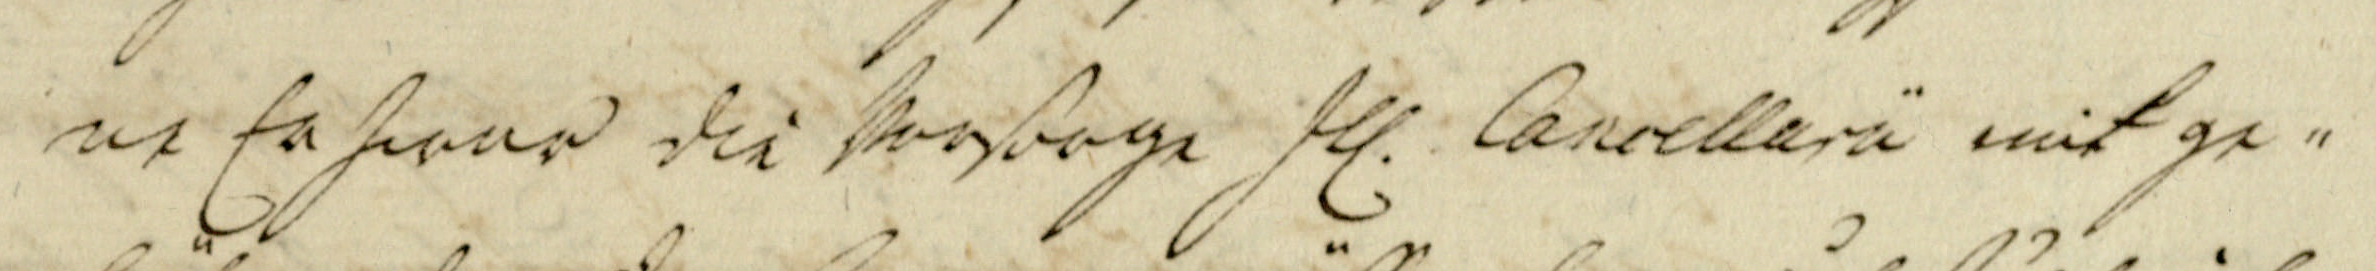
ne Er zwar die Vorsorge Ill. Cancellarii mit ge¬
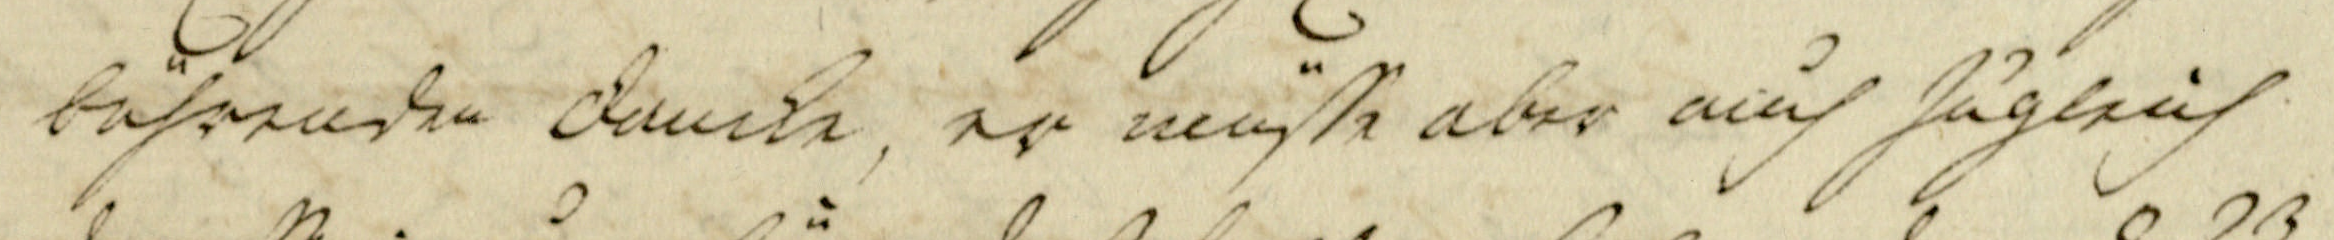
bührenden Dancke, er müsse aber auch zugleich
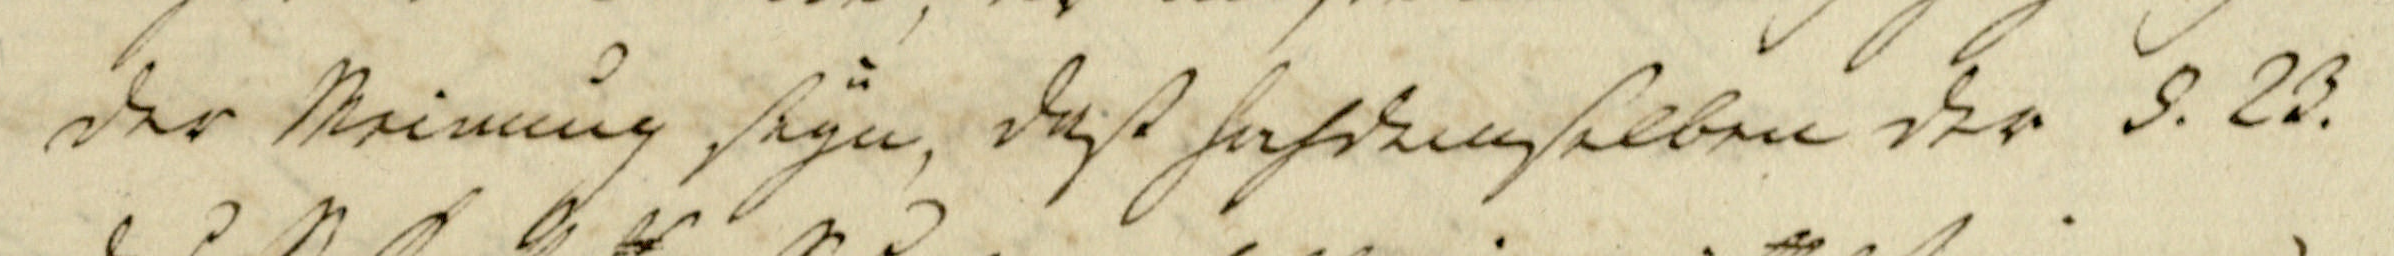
der Meinung seÿn, daß Hochdemselben der §. 23.
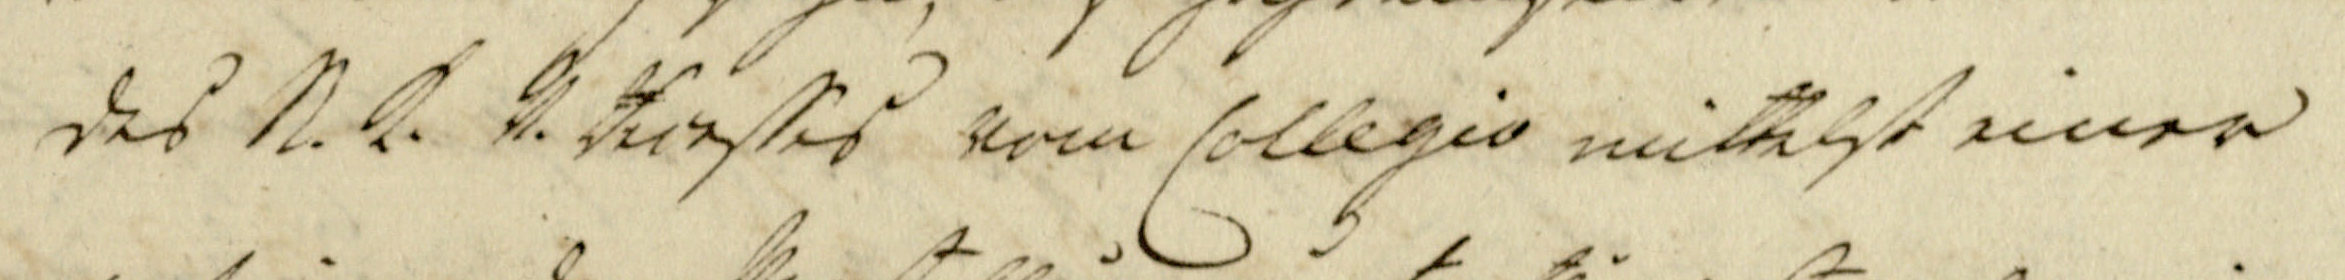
des N. . K. Recesses vom Collegio mittelst einer
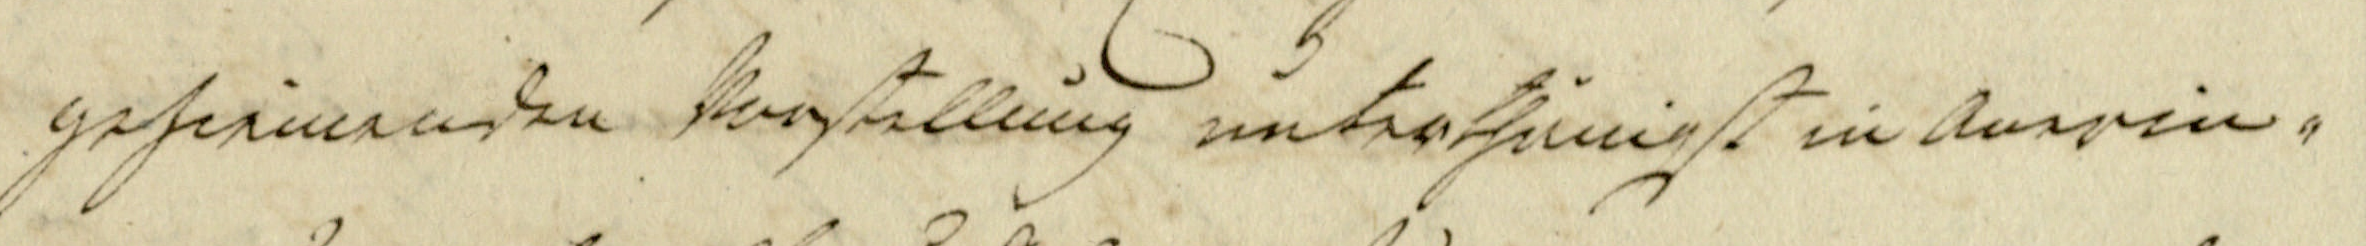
geziemenden Vorstellung unterthänigst in Anerin¬
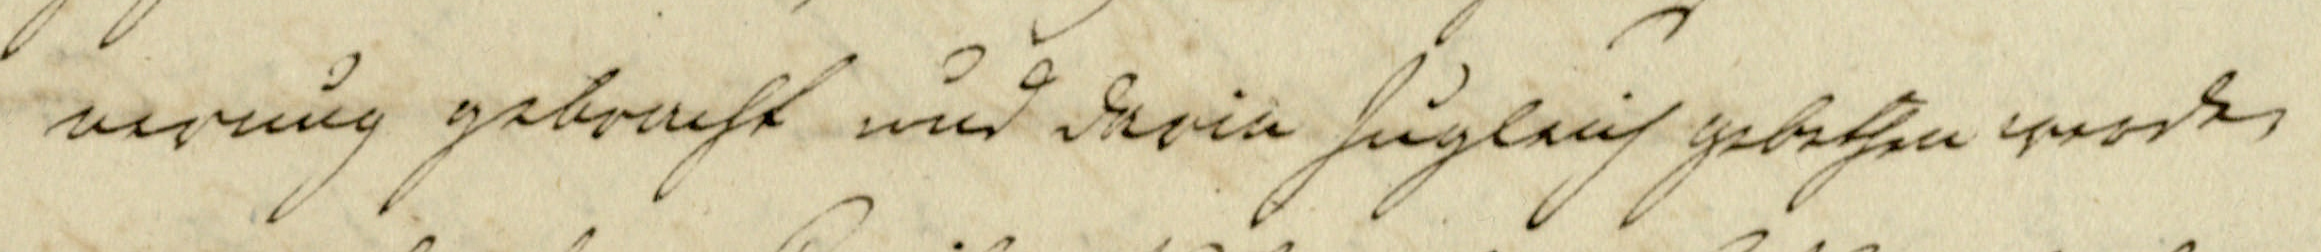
nerung gebracht und darin zugleich gebethen werden,
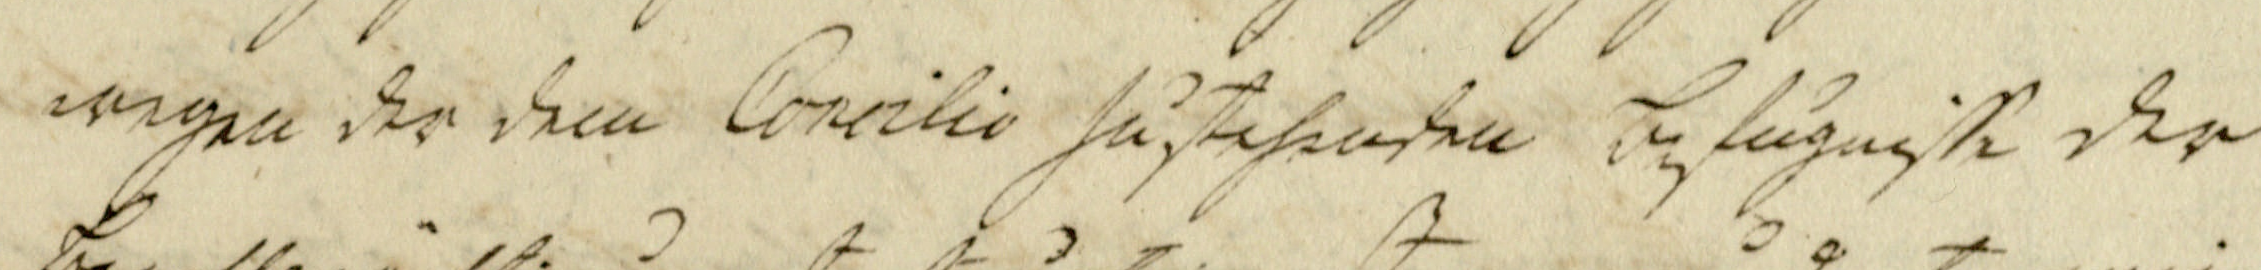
wegen der dem Concilio zustehenden Befugnisse der
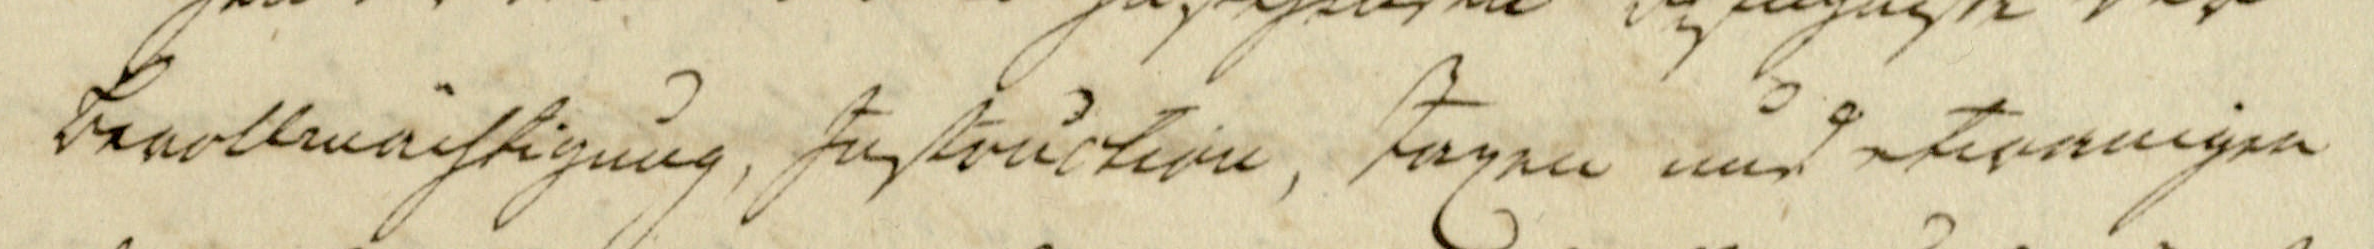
Bevollmächtigung, Instruction, Taxen und etwanigen
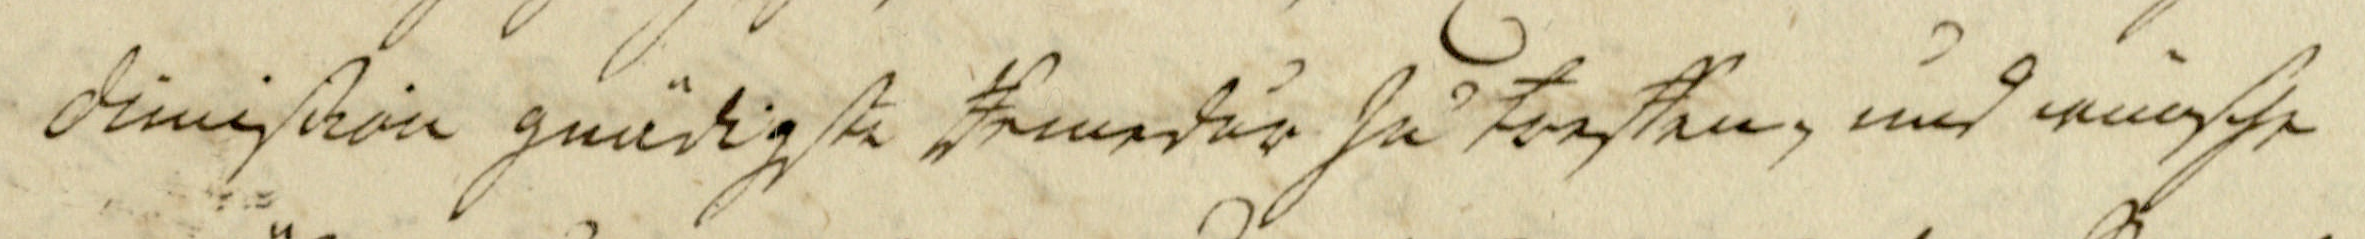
dimission gnädigste Remedur zu treffen; und wünsche
